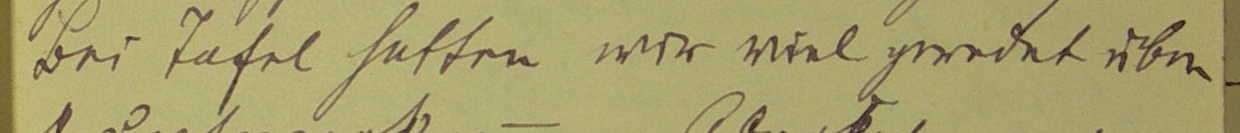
Bei Tafel hatten wir viel geredet über
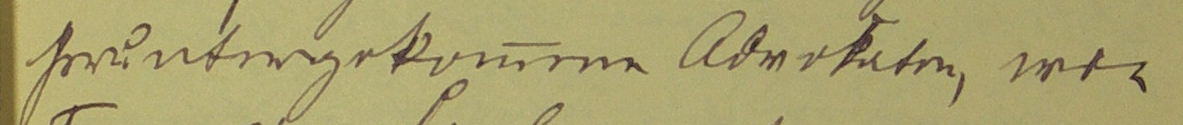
heruntergekommene Advokaten, wie
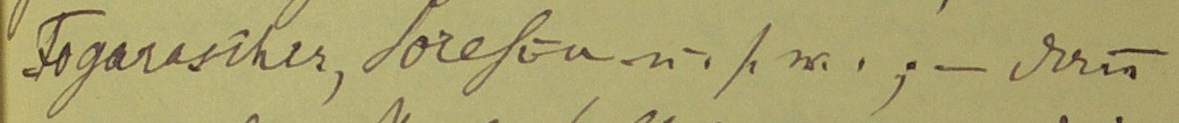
Fogarascher, Locefon u.s.w.; - Dan
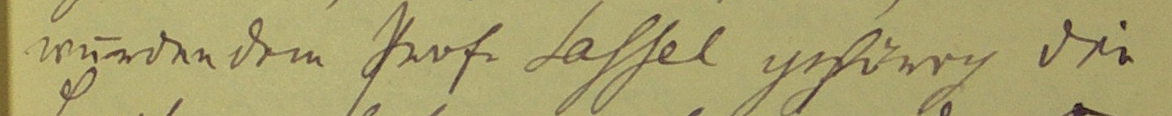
wurden dem Prof. Lassel gehörig die
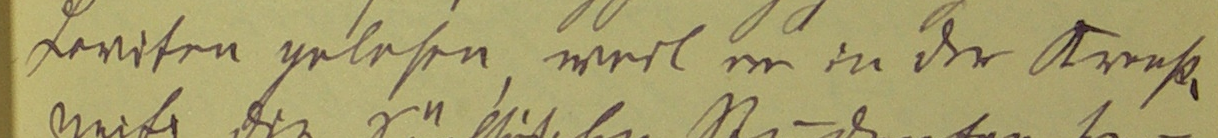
Leviten gelesen, weil er in der Kronst.
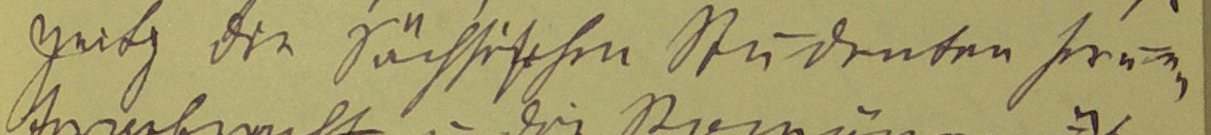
Zeitg die Sächsischen Studenten herun¬
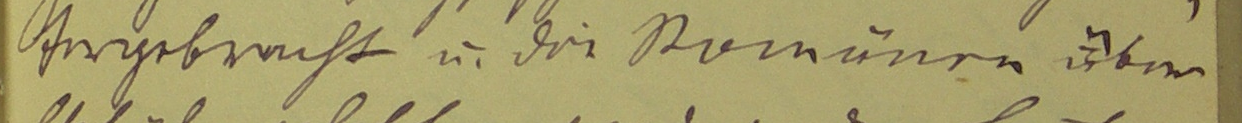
tergebracht und die Romänen über
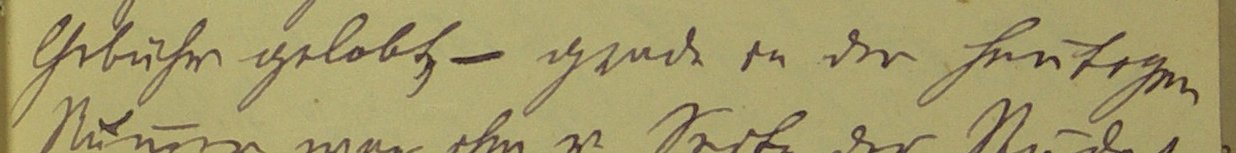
Gebühr gelobt, - gerade in der heutigen
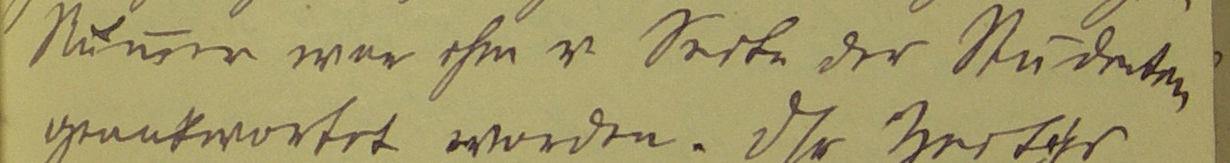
Numer war ihm v. Seiten der Studenten
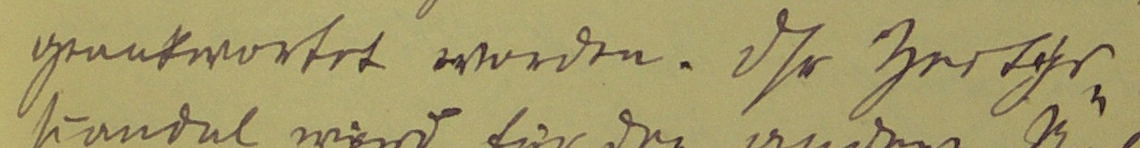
geantwortet worden. Dieser Zeitungs¬
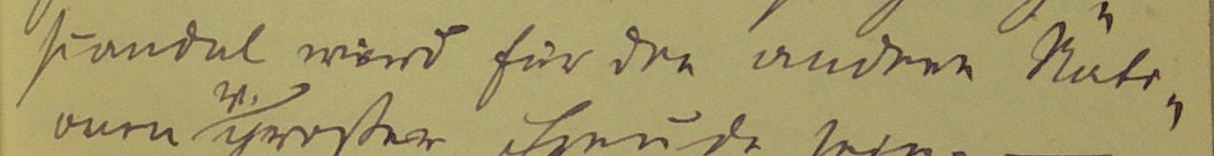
scandal wird für die andere Natio¬
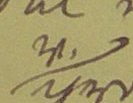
von
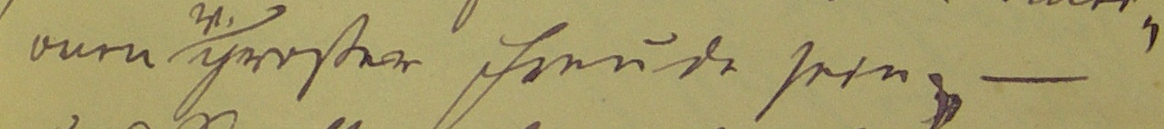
nen großer Freude sein, -
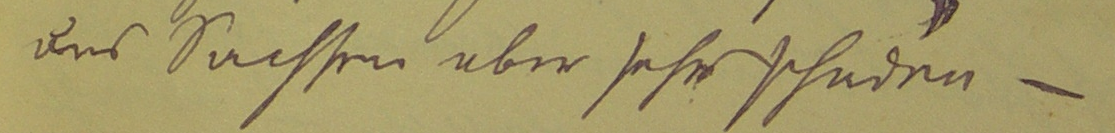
uns Sachsen aber sehr schaden -
